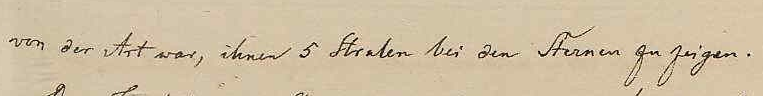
von der Art war, ihnen 5 Stralen bei den Sternen zu zeigen.
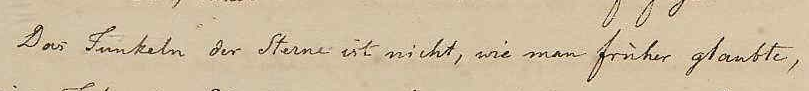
Das Funkeln der Sterne ist nicht, wie man früher glaubte,
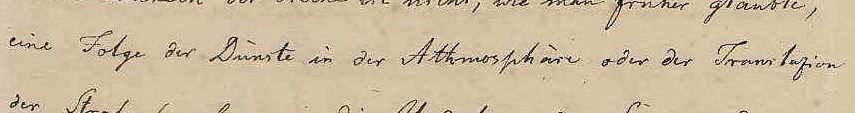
eine Folge der Dünste in der Athmosphäre oder der Translazion
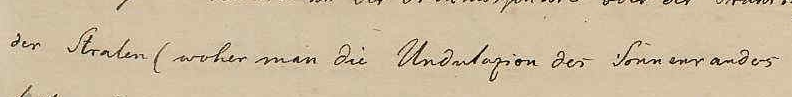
der Stralen (woher man die Undulazion des Sonnenrandes
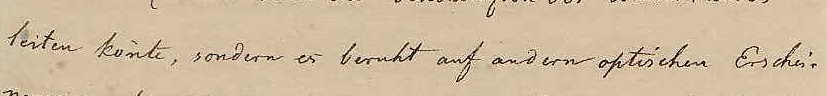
leiten könte, sondern es beruht auf andern optischen Erschei-
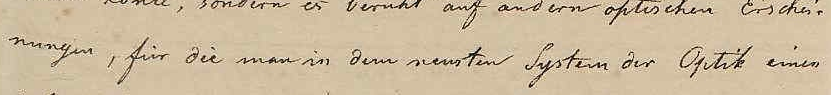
nungen, für die man in dem neusten System der Optik einen
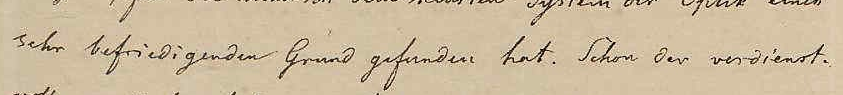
sehr befriedigenden Grund gefunden hat. Schon der verdienst-
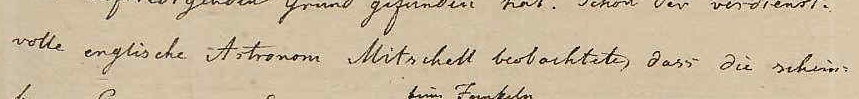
volle englische Astronom Mitschell beobachtete, dass die schein-
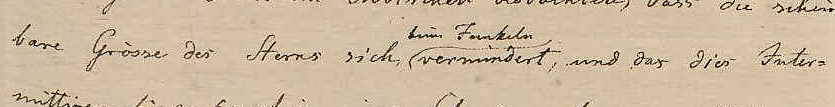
bare Grösse des Sterns sich beim Funkeln vermindert, und das dies Inter-
